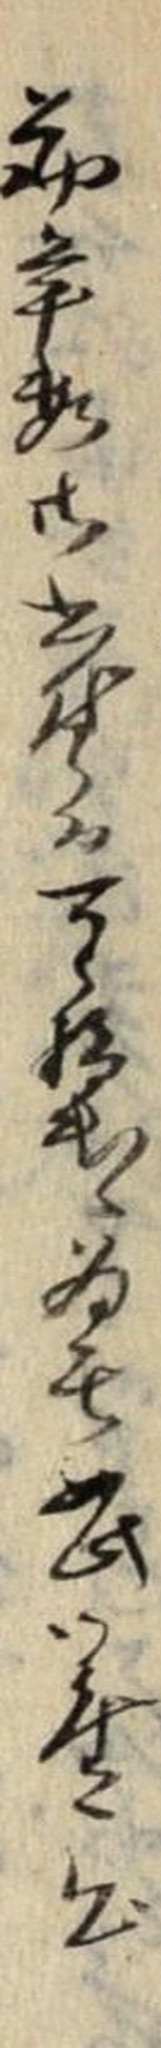勤年数御書付に而可被指出候為其如此御座候以上
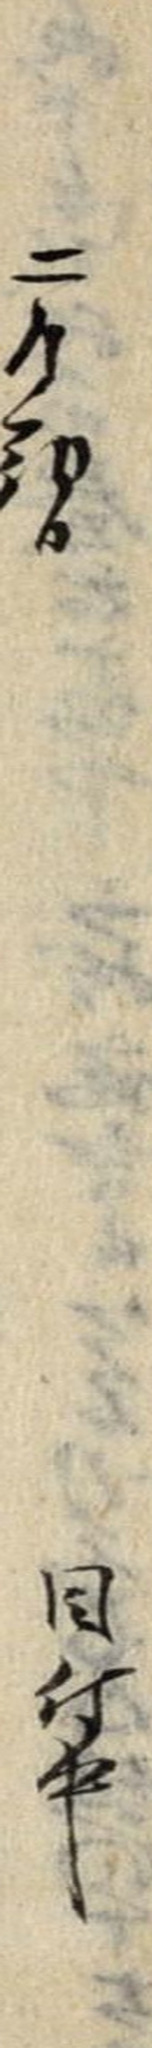二月朔日目付中
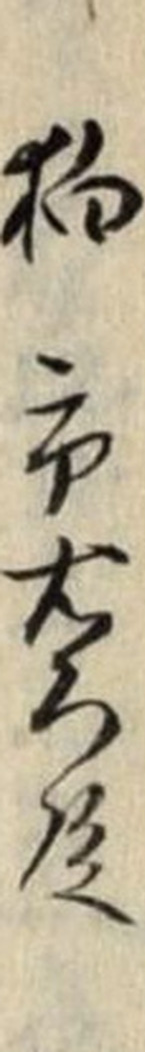同狛市右衛門殿
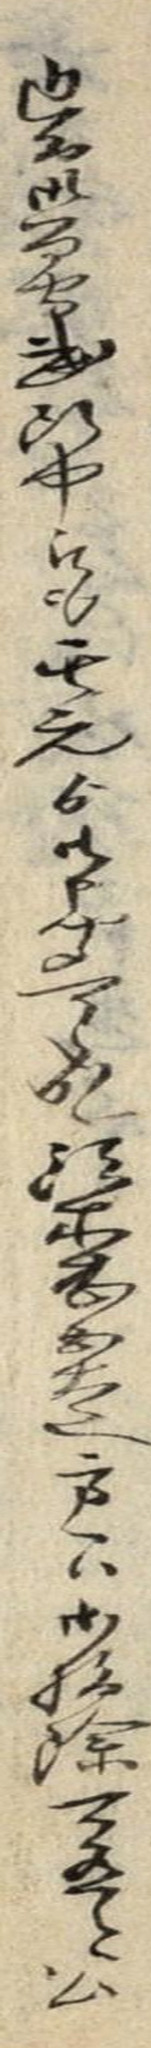追而御留守武頭中江も其元ゟ御被聞可成候鈴木甚五太夫方へは御指除可有之候以上
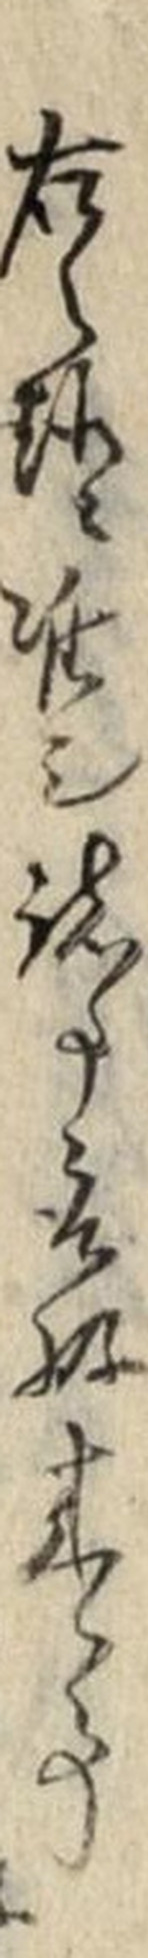右之趣に准し諸事取扱来候事
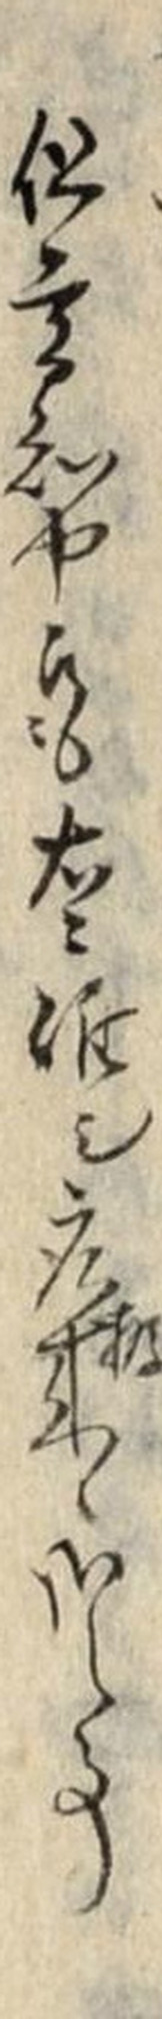但高知中江も右に准し取扱来候御事
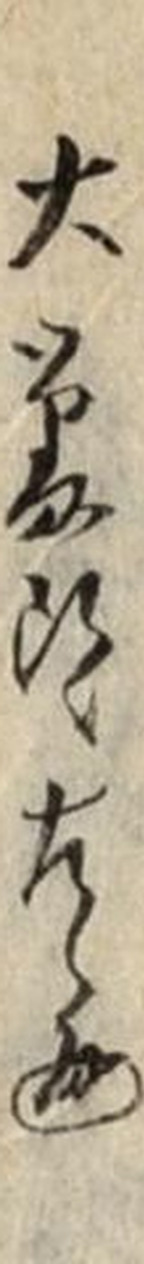大御番頭へ左之通
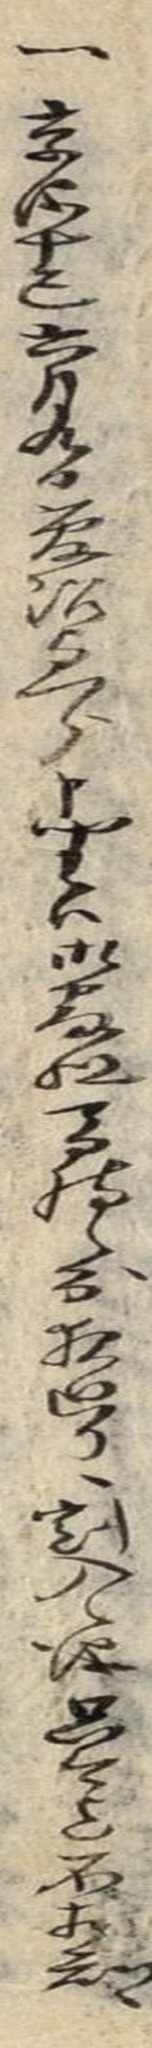一享保十巳六月九日菅沼与一郎申聞候ハ御番組馬持之分夜廻りへ割入候儀只今迄不相知候
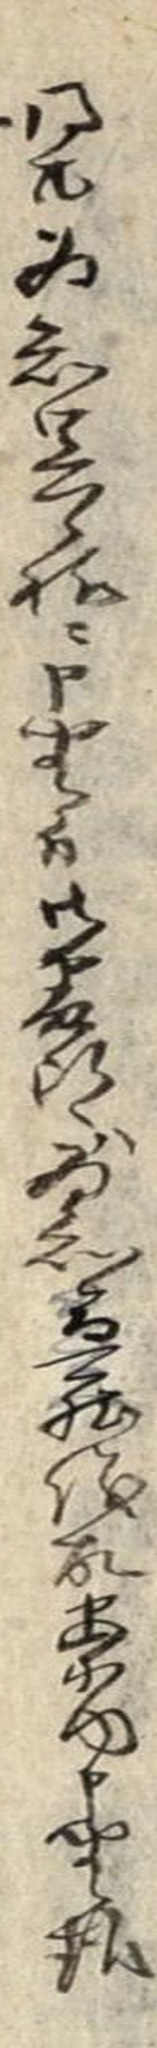得共為知呉候様に申聞候に付御番頭へは為知候旨可然儀故案内申聞候趣
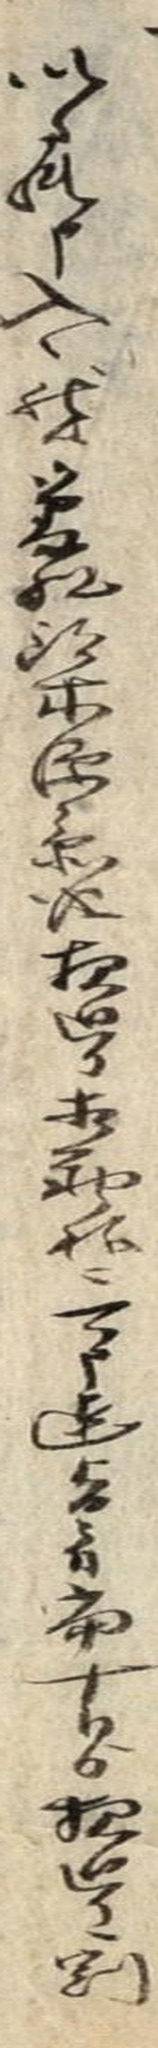以手紙申入候然は御番組鈴木源兵衛儀夜廻り相勤候様に可申達候旨に付当十日ゟ夜廻りへ割
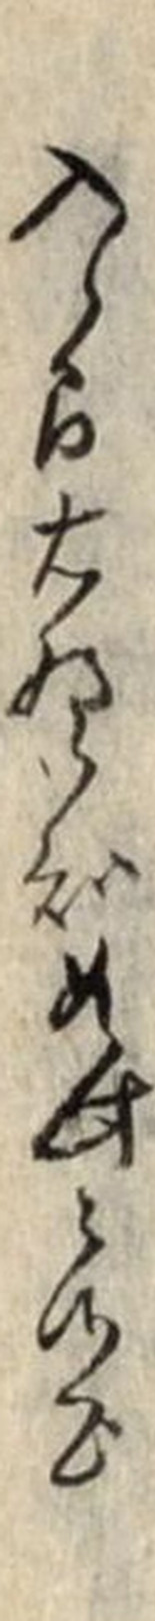入候間右為御知如此に候以上
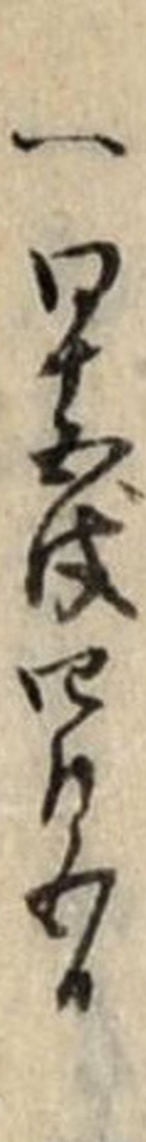一同十五戌四月五日
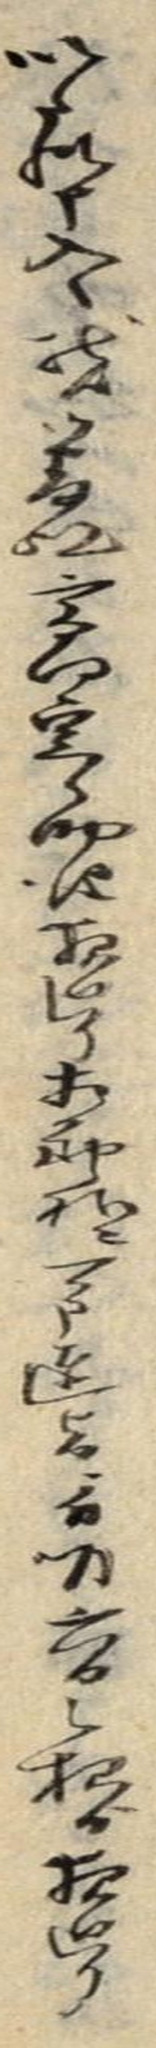以手紙申入候然は御番組高田定之助儀夜廻り相勤候様に可申達旨に付明六日之夜ゟ相廻り

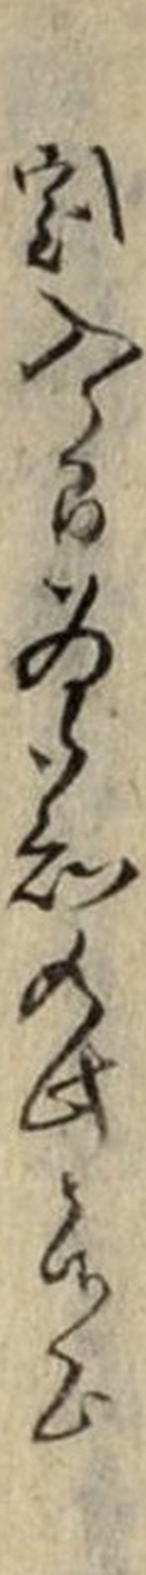割入候間為御知如此に候以上
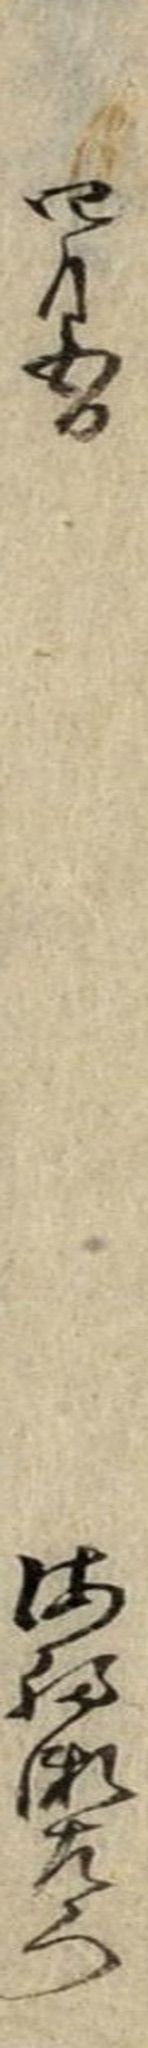四月五日海福瀬左衛門
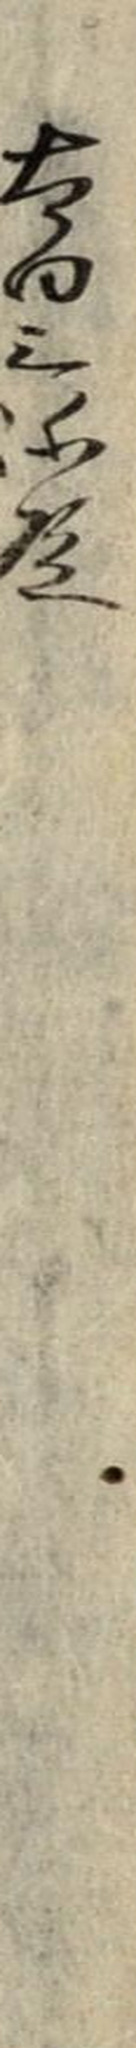太田三弥殿
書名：蒐輯之部
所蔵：福井県文書館 Fukui Prefectural Archives
